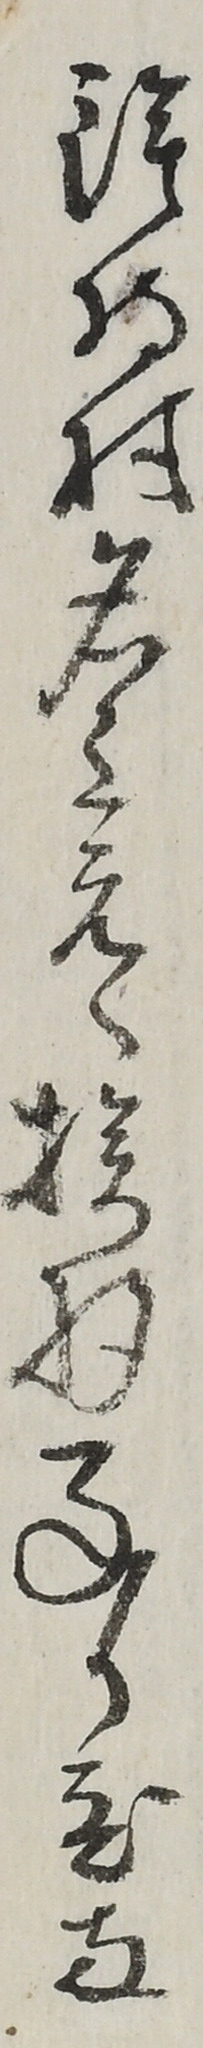鉾持村名主元へ挨拶承り置両
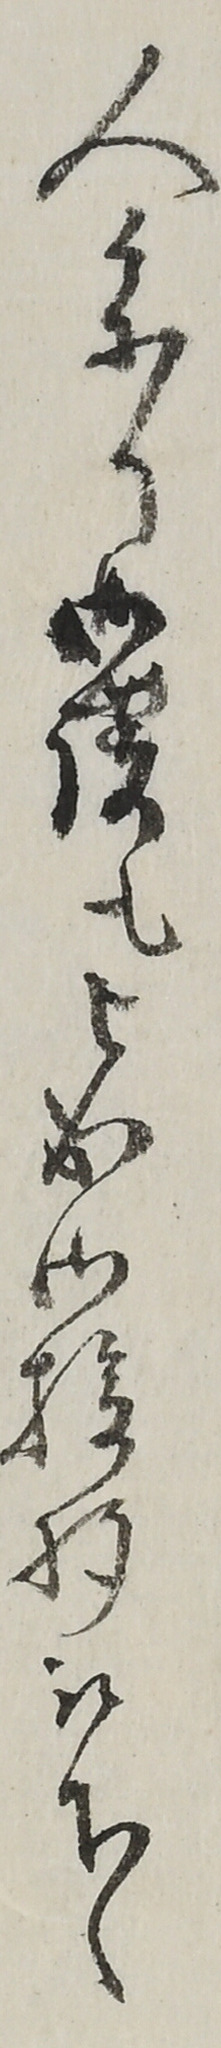人参り御談も被成御挨拶被下候
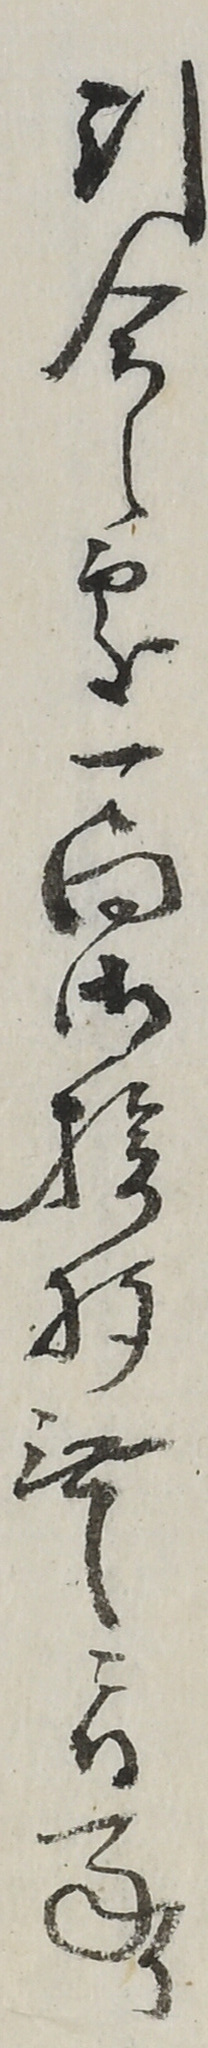引合之処一向御挨拶無之ニ付承り
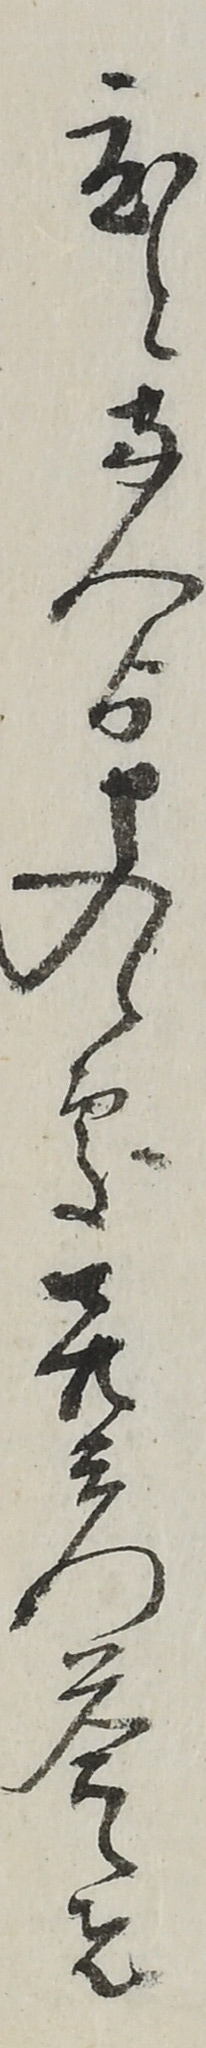度と両人ゟ申入候処喜右衛門答候者
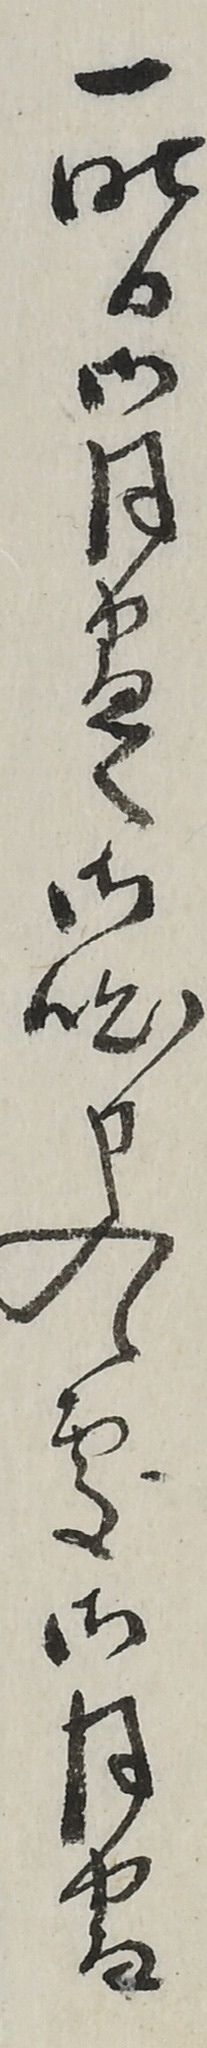一昨日御月番へ御咄申入候処御月番
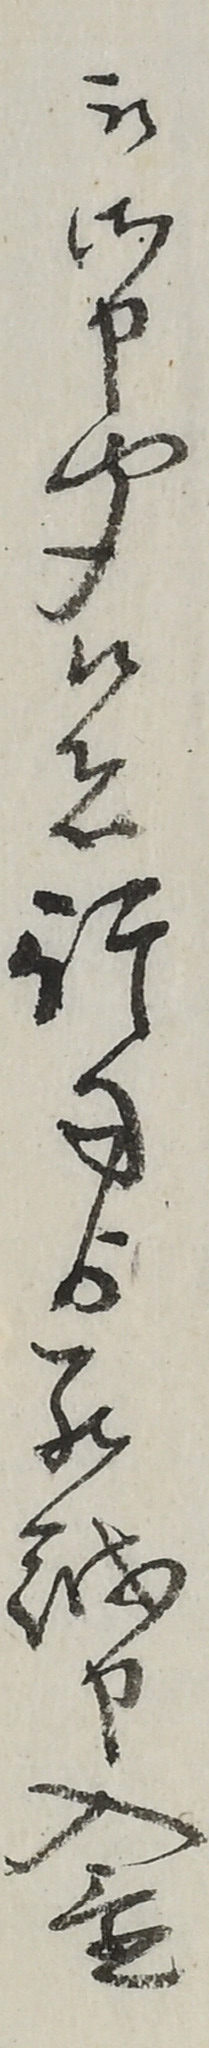被御申聞候者行司ゟ罷越申入置
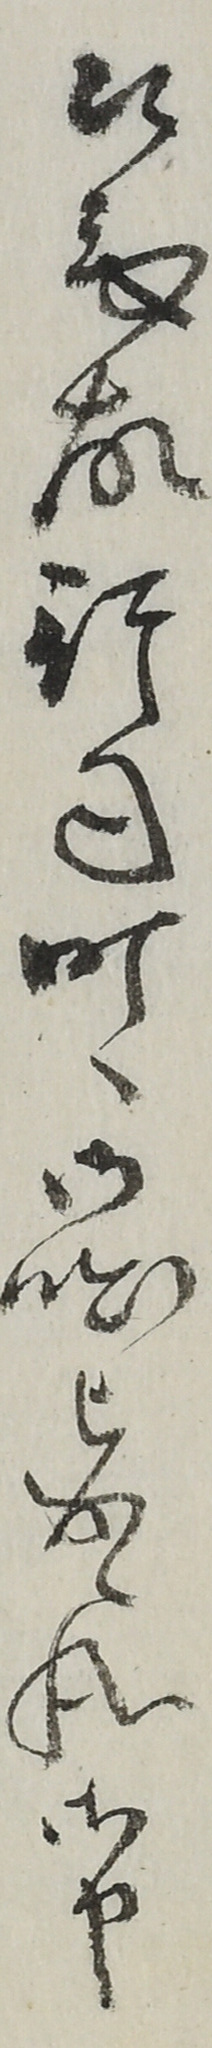候義故行司町へ御咄被成候様御申
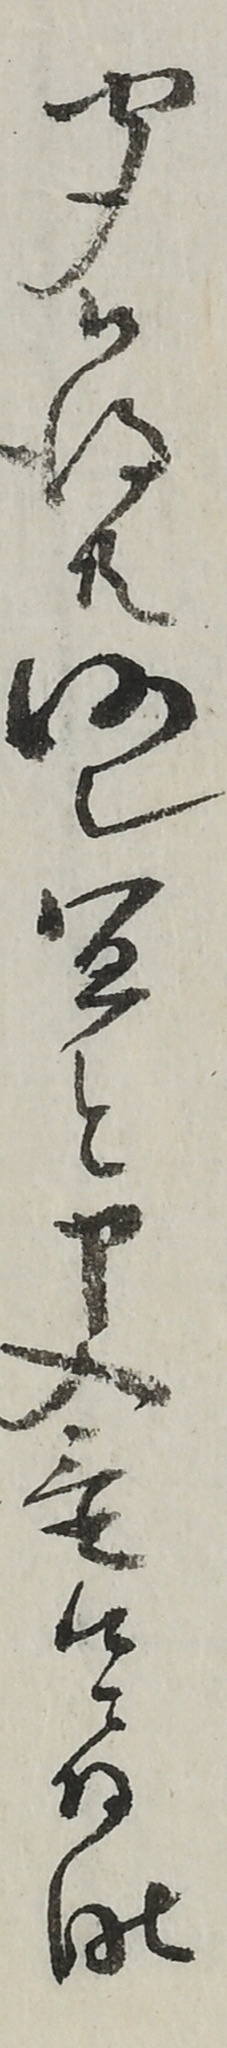聞候得共何レ宜と申入置候ニ付昨
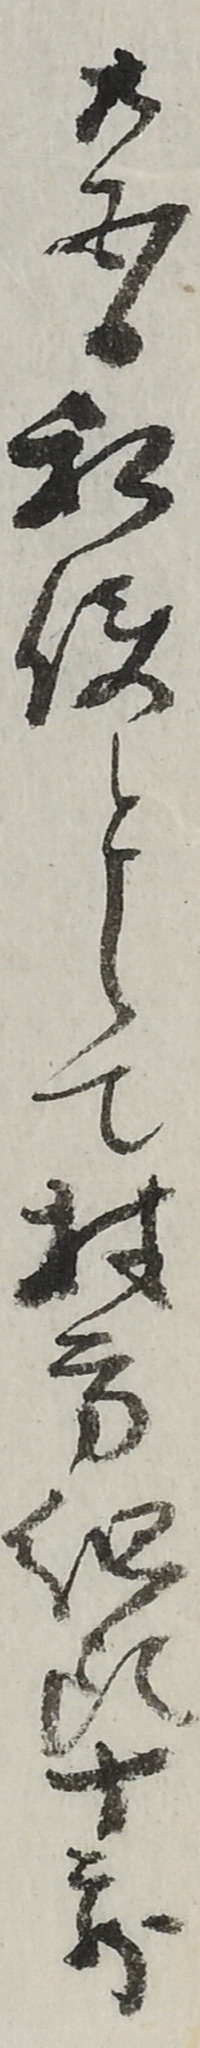廿五日私使として村方組頭十蔵
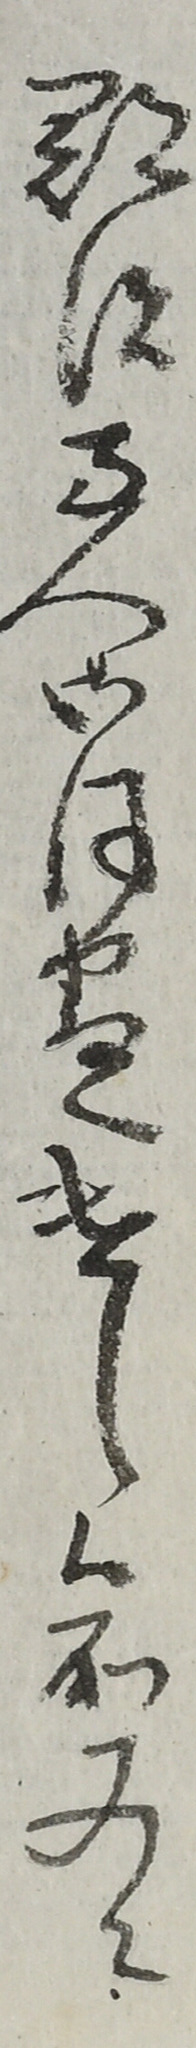郡治両人御月番へ遣し候所又々
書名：鉾持村風祭登山に付掛合の次第
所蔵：伊那市立高遠町図書館・合同会社AMANE
